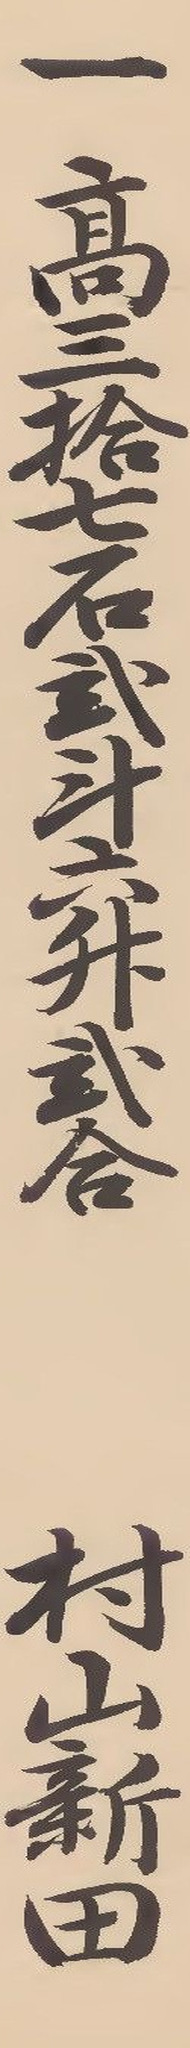一高三拾七石弐斗六升弐合村山新田
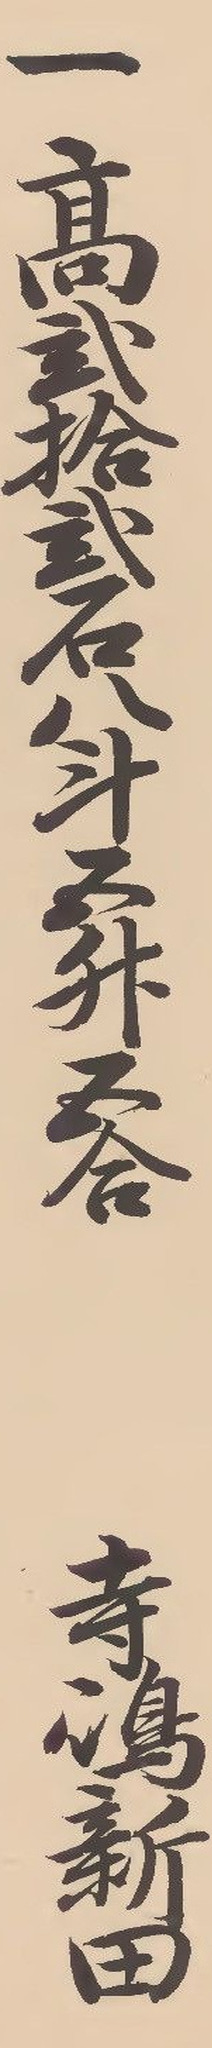一高弐拾弐石八斗五升五合寺島新田
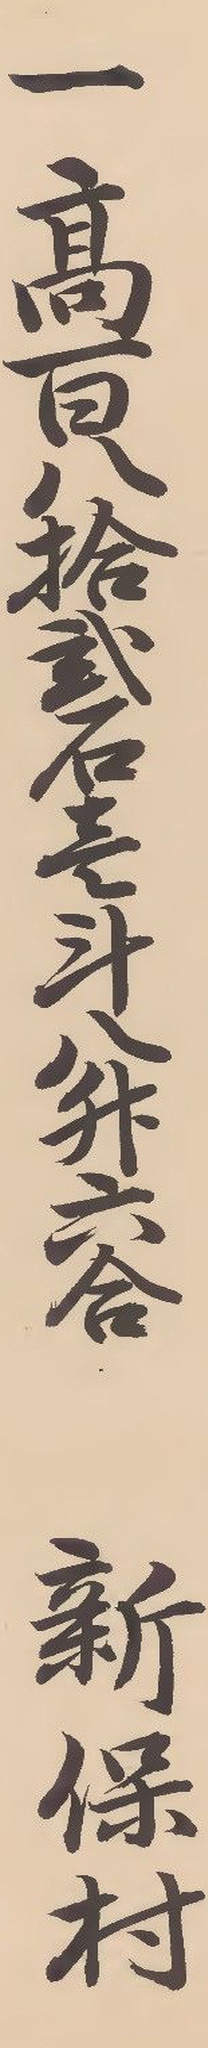一高百八拾弐石壱斗八升六合新保村
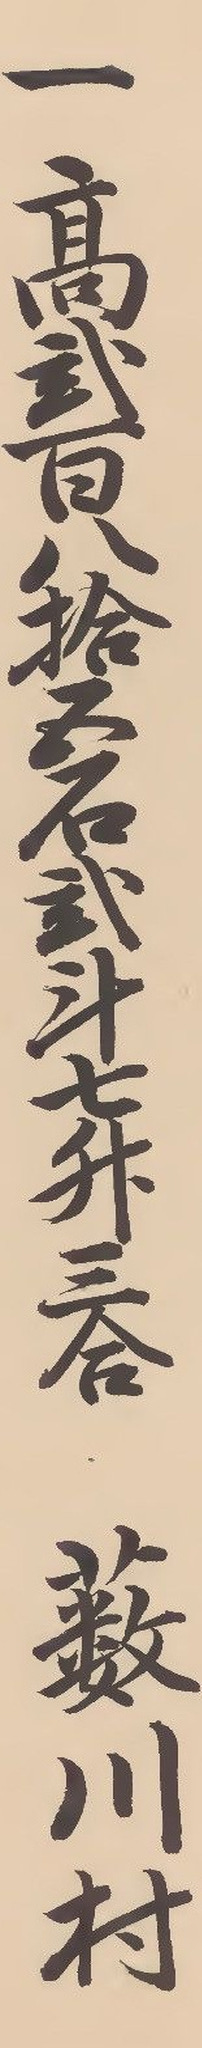一高弐百八拾五石弐斗七升三合薮川村
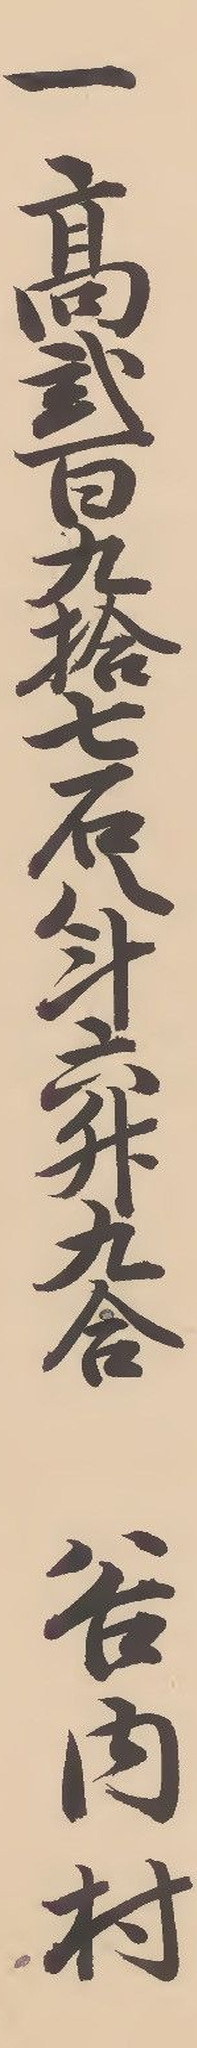一高弐百九拾七石八斗六升九合谷内村

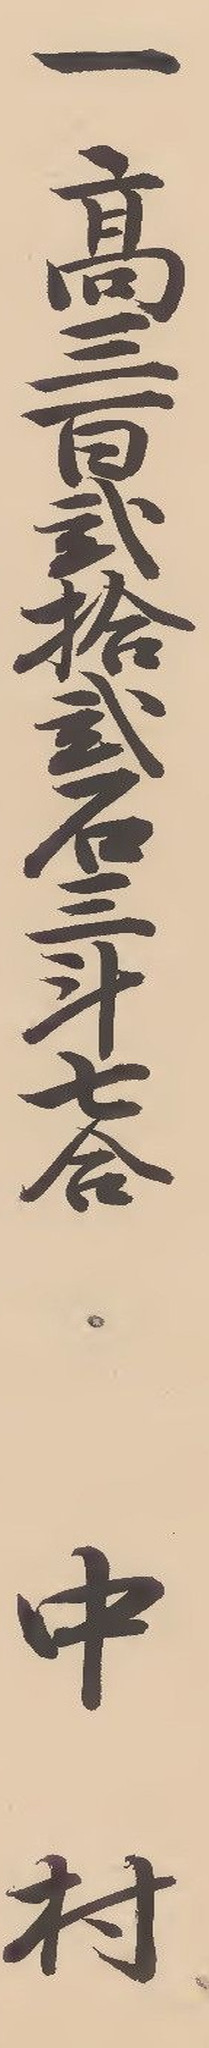一高三百弐拾弐石三斗七合中村
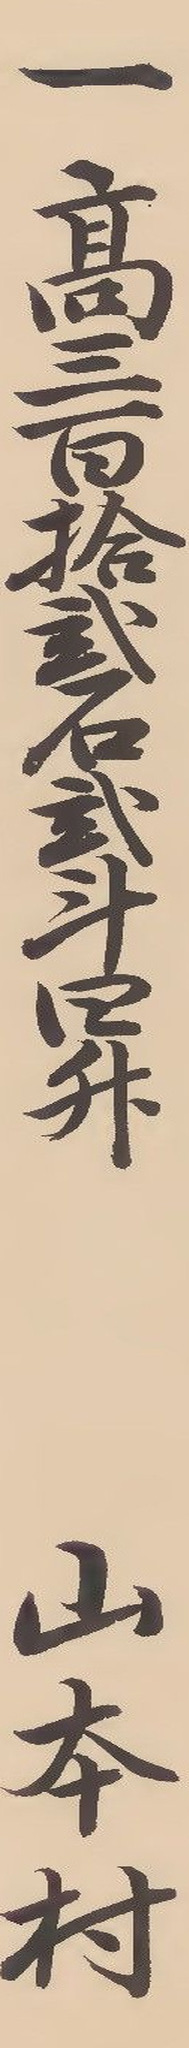一高三百拾弐石弐斗四升山本村
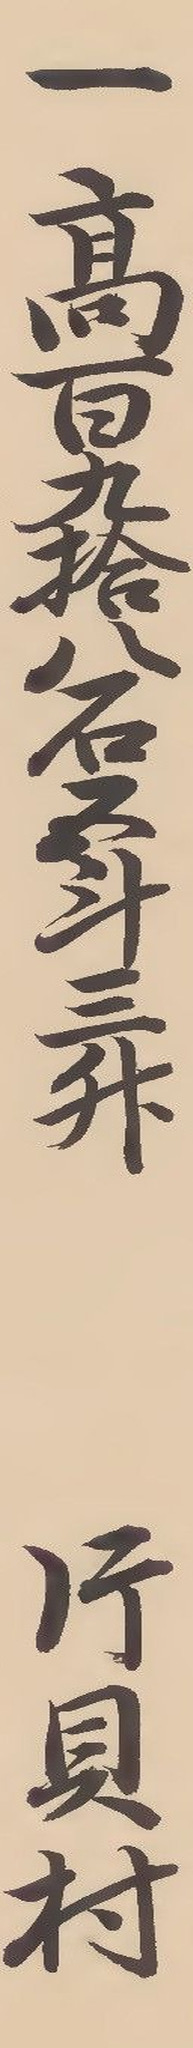一高百九拾八石五斗三升片貝村
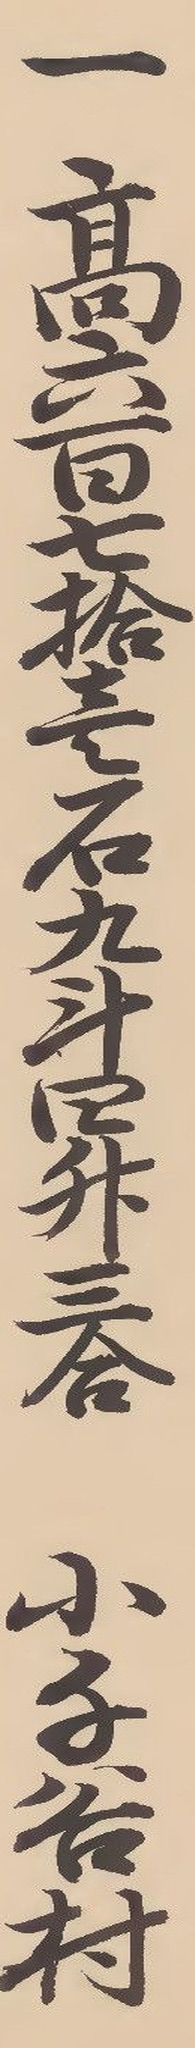一高六百七拾壱石九斗四升三合小千谷村
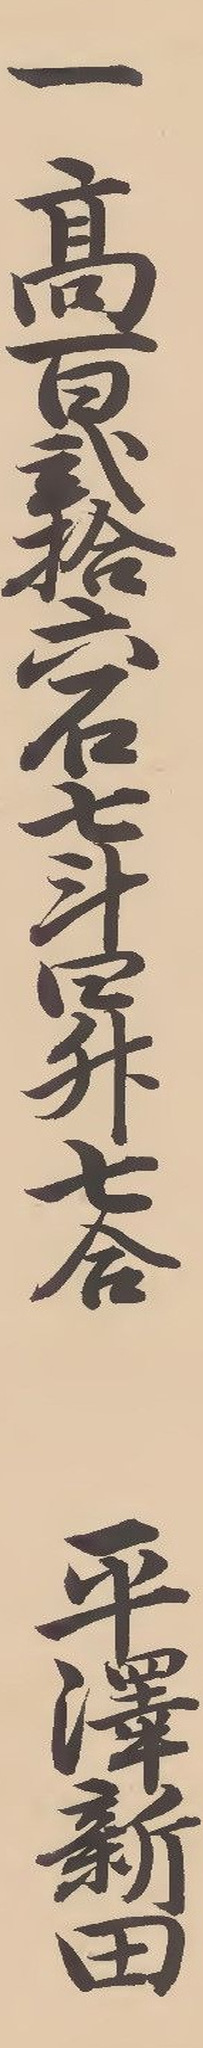一高百弐拾六石七斗四升七合平沢新田
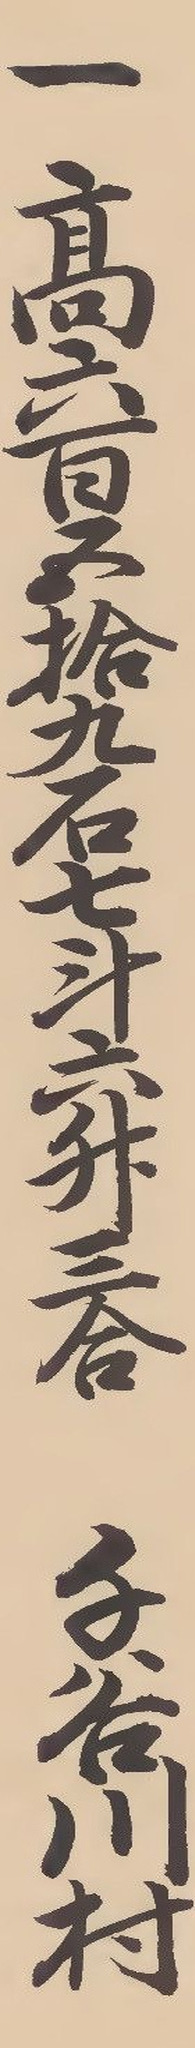一高六百五拾九石七斗六升三合千谷川村
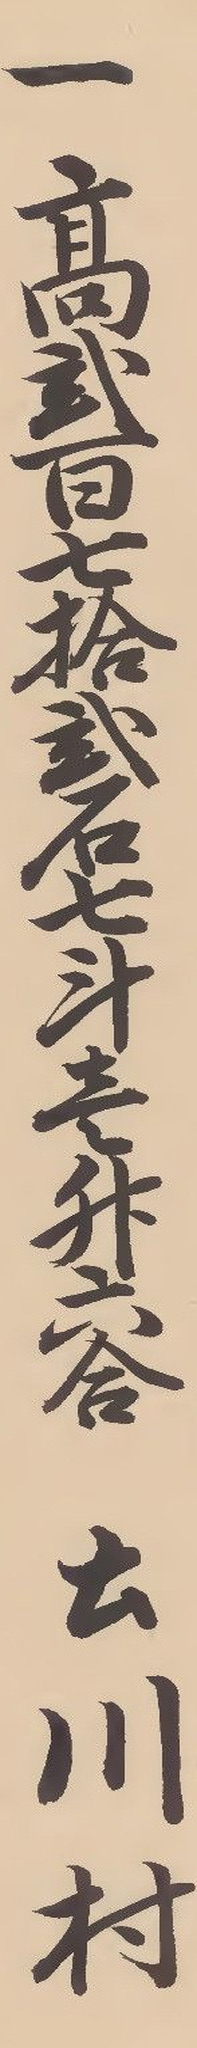一高弐百七拾弐石七斗壱升六合土川村
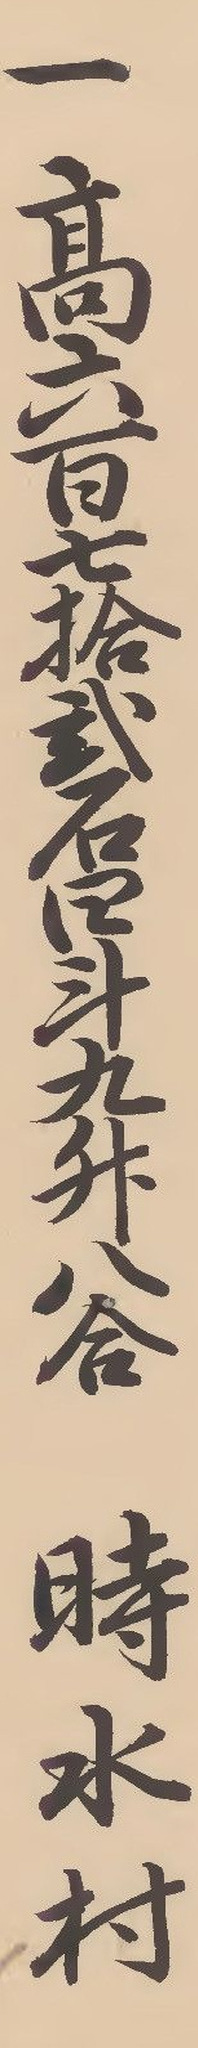一高六百七拾弐石四斗九升八合時水村

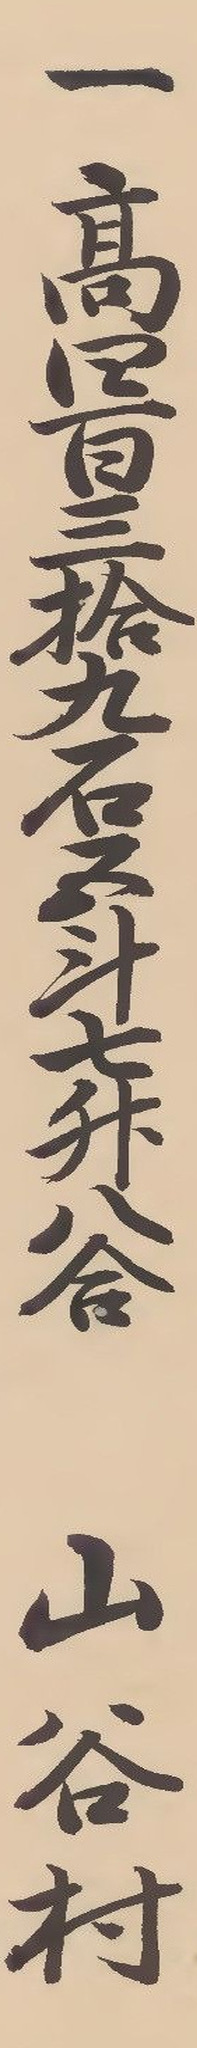一高四百三拾九石五斗七升八合山谷村
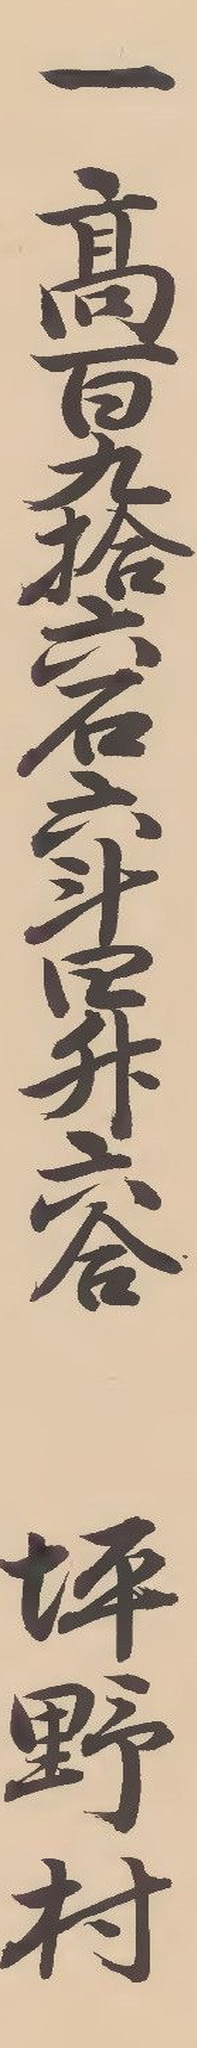一高百九拾六石六斗四升六合坪野村
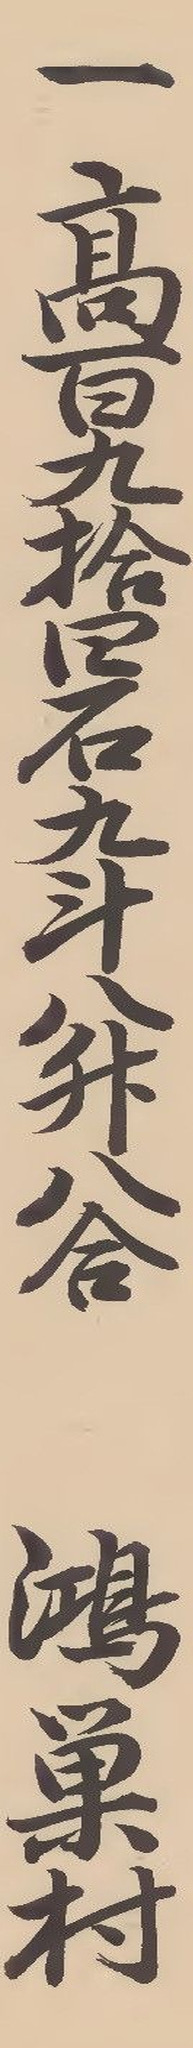一高百九拾四石九斗八升八合鴻巣村
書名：越後国郷帳　中
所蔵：国立公文書館 National Archives of Japan
